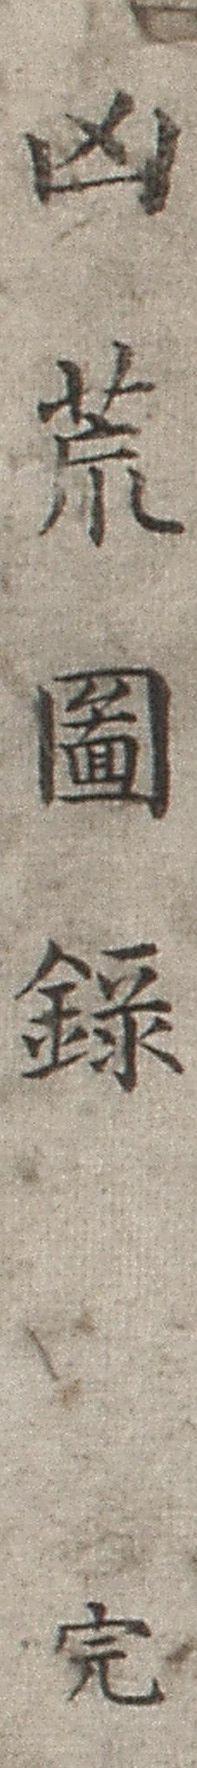凶荒図録完

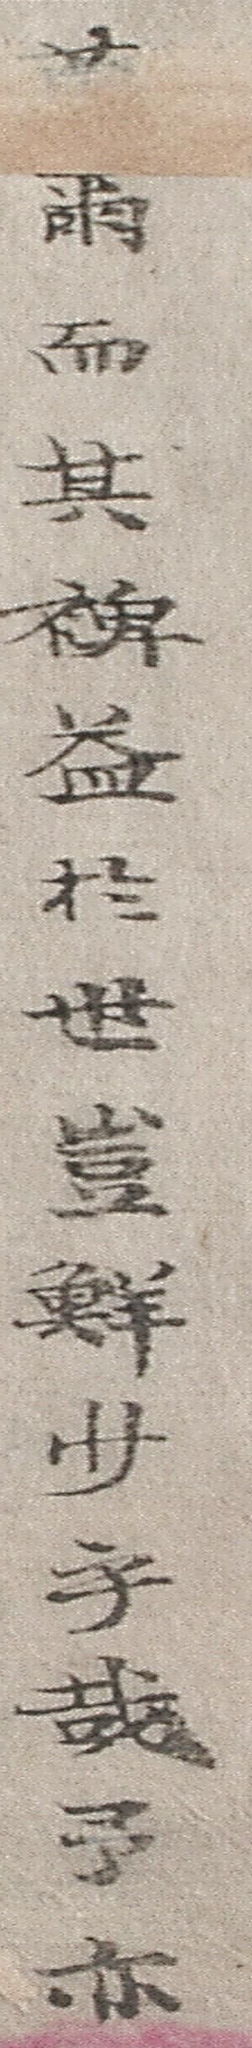蕞爾而其裨益於世豈鮮少乎哉予亦
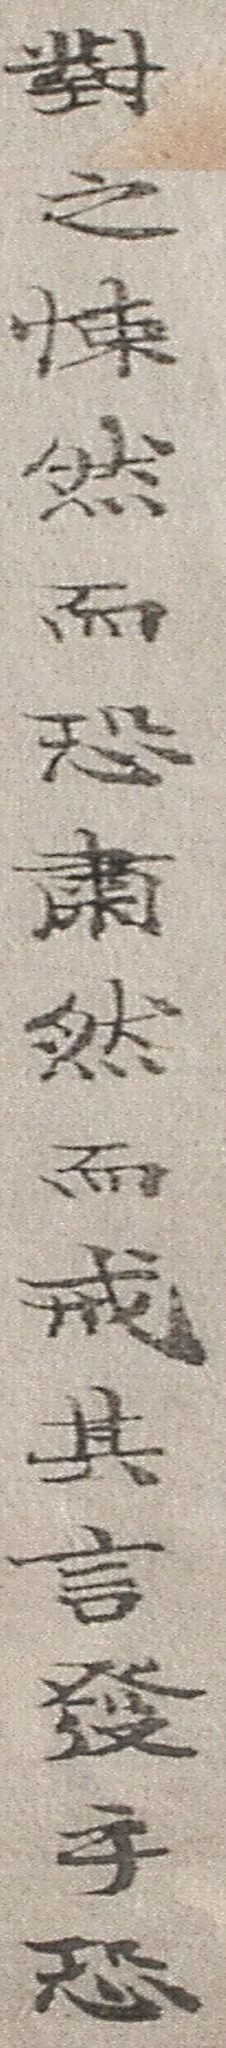対之悚然而恐粛然而戒其言発乎恐
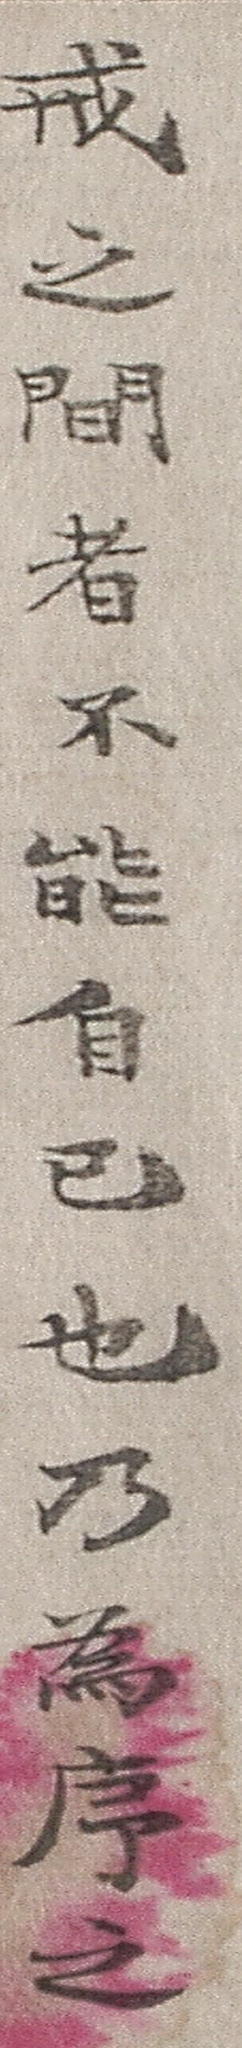戒之間者不能自已也乃為序之
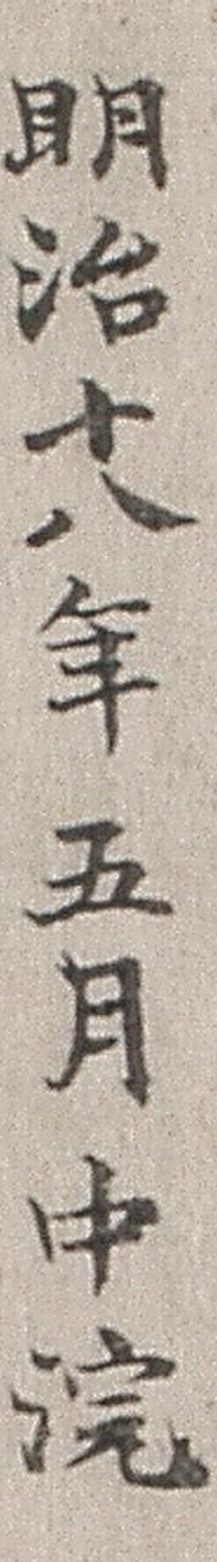明治十八年五月中浣
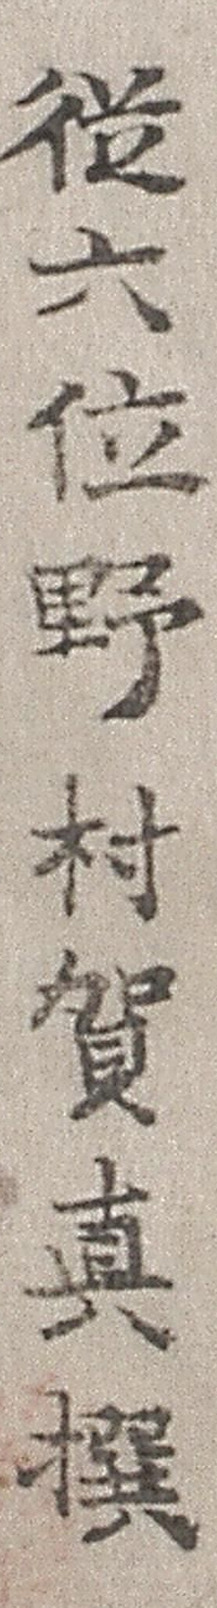従六位野村賀真撰
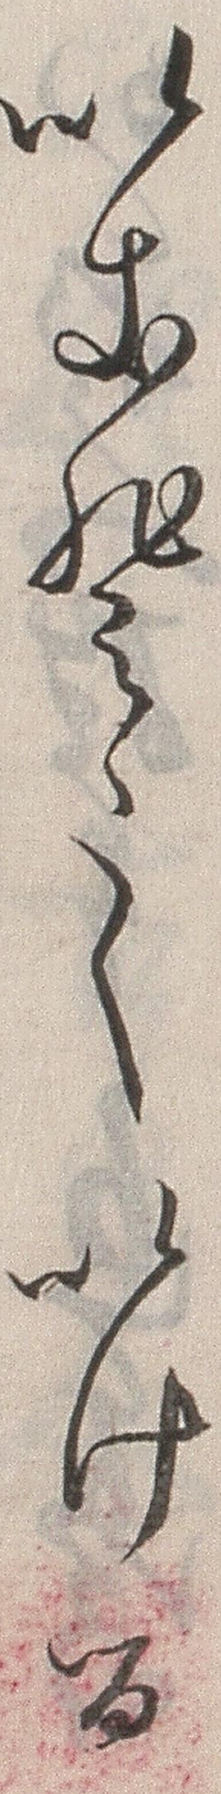いきとしいける
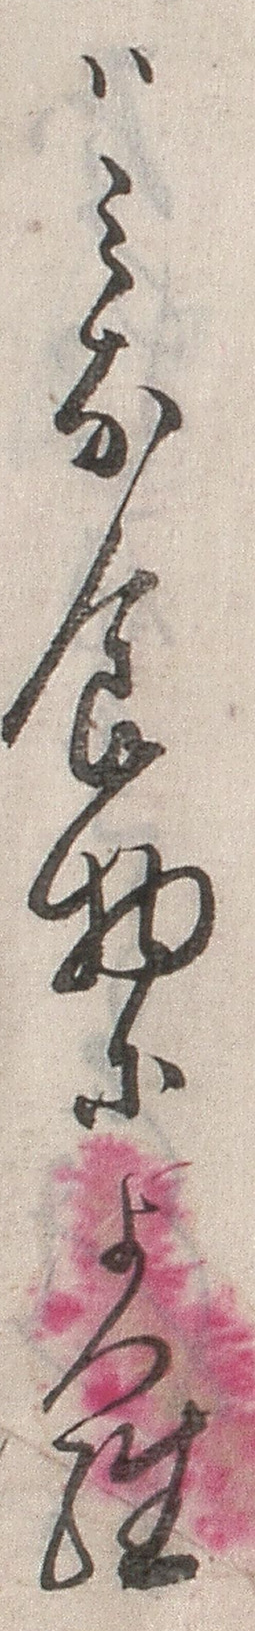はみな食物によら
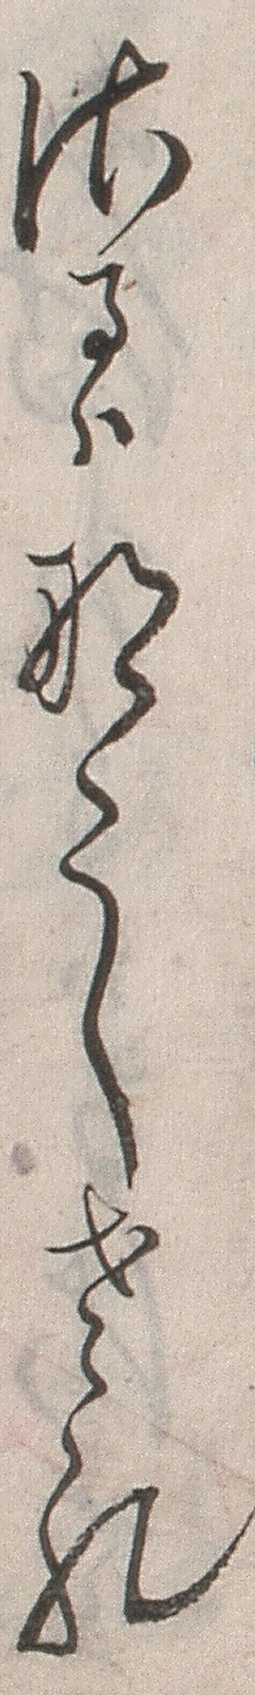さるはなしされ
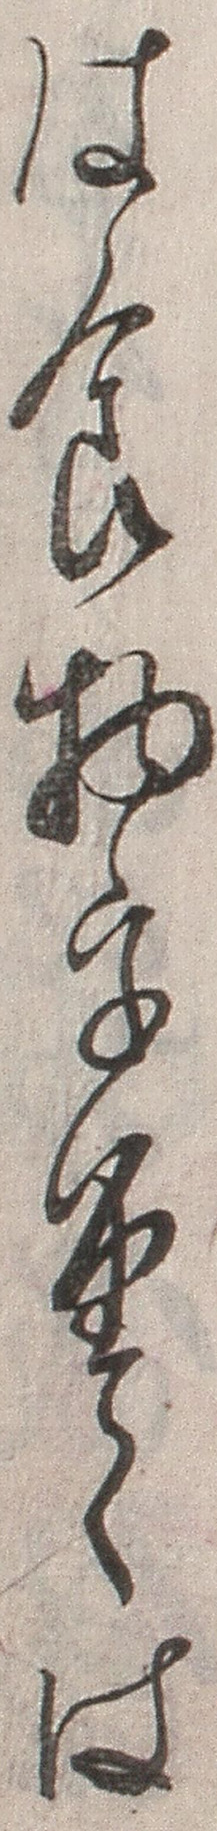は食物をたくは

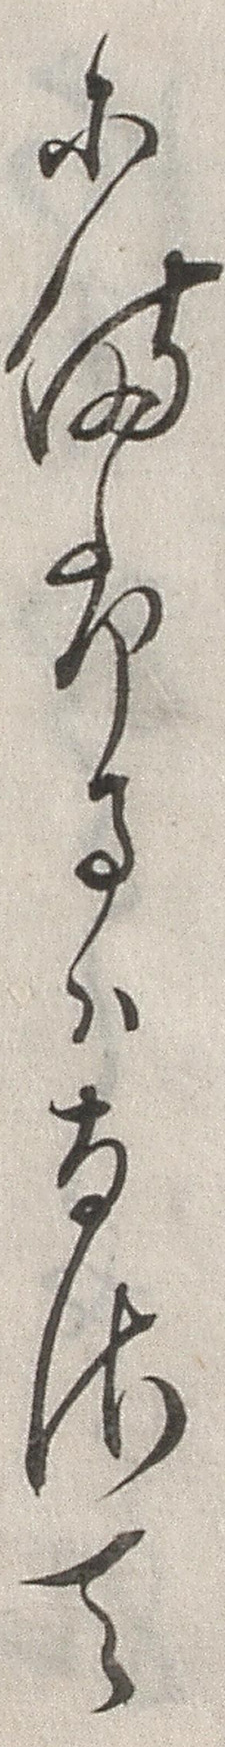に備ふるはなさて
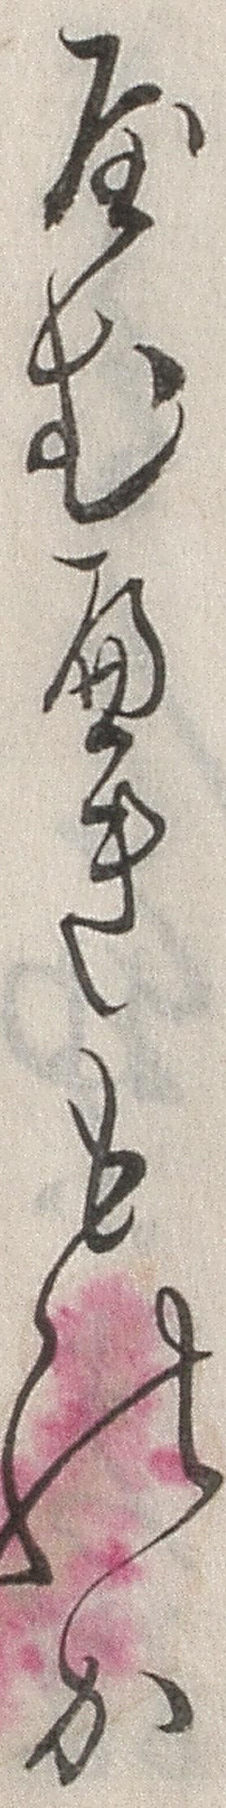やむへきものか
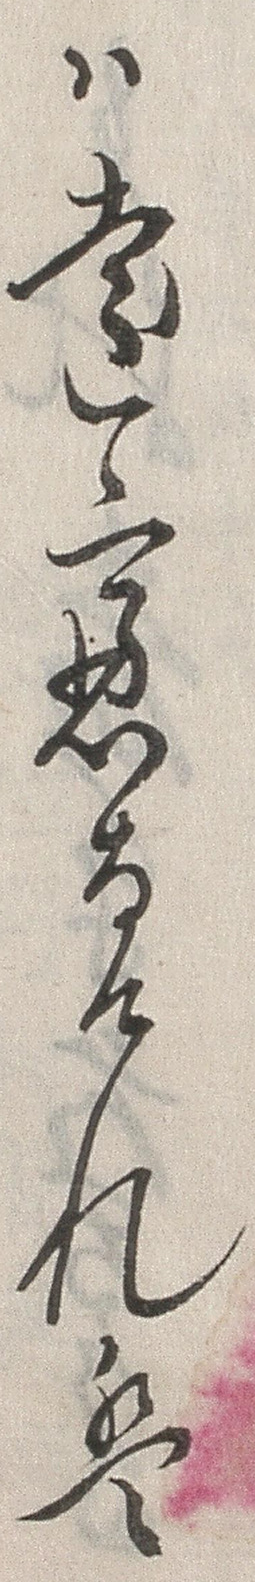は遠慮なけれは
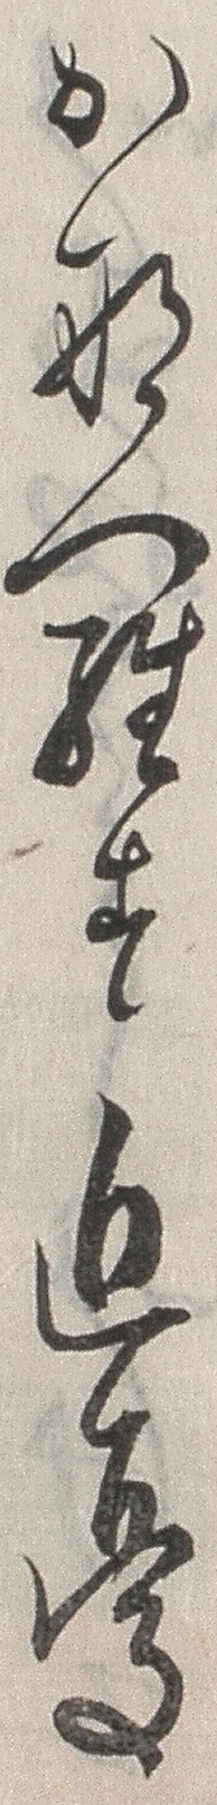かならす近憂
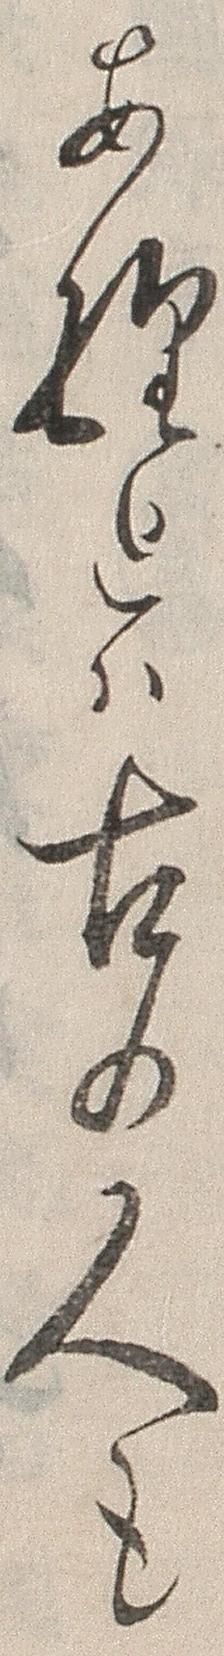ありとは古の人も
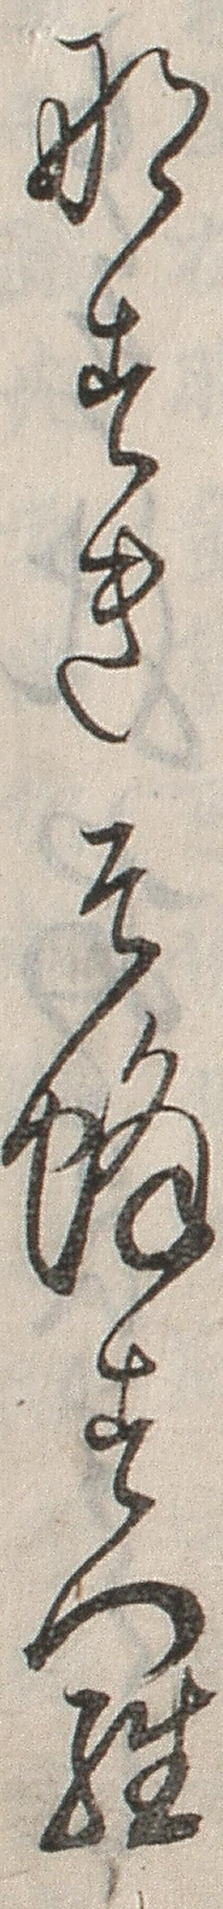なすきそ蜂すら
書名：凶荒図録　完
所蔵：東京大学地震研究所図書室 Earthquake Research Institute Library, The University of Tokyo, JAPAN
